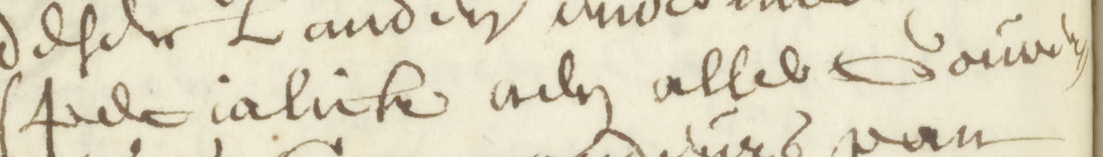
specialick aen alle Gouver„
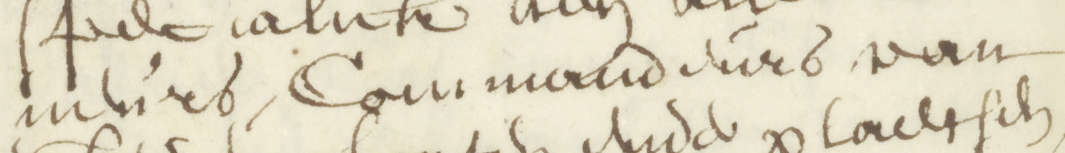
neurs, Commandeurs van
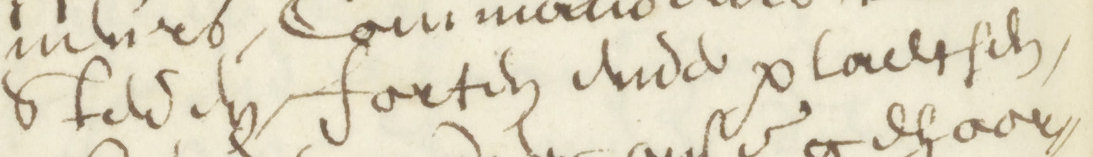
steden, forten ende plaetsen,
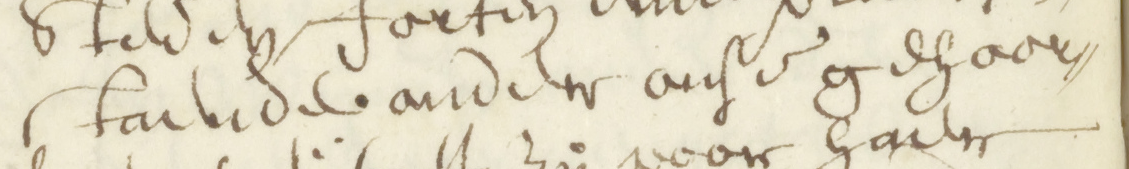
staende onder onse gehoor„
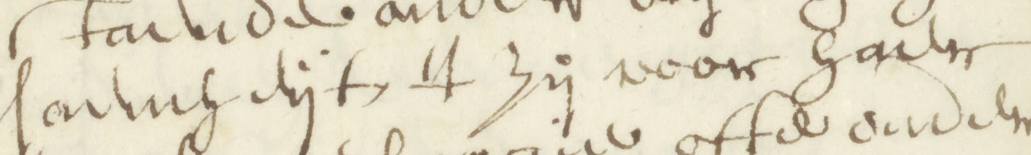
saemheijt, 't zij voor haer
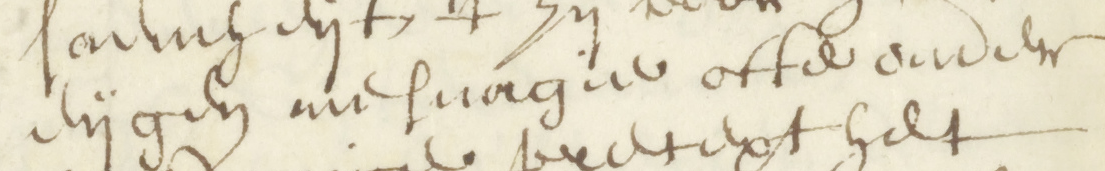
eijgen mesnagie ofte onder
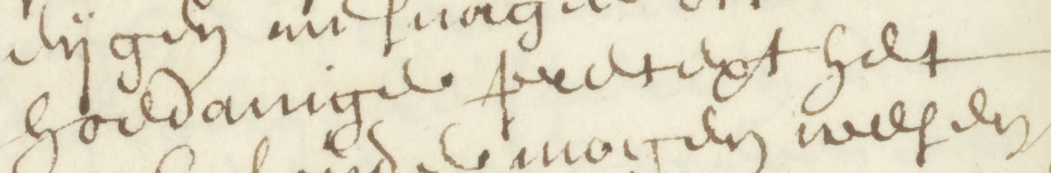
hoedanige pretext het
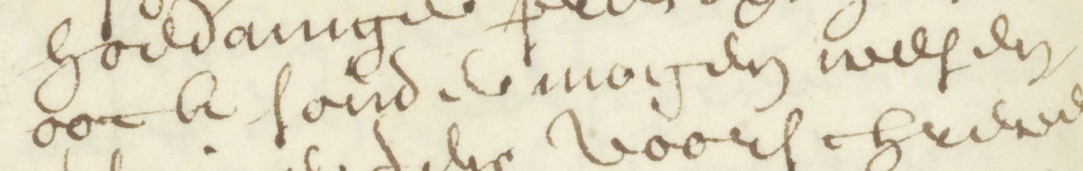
oock soude mogen wesen,
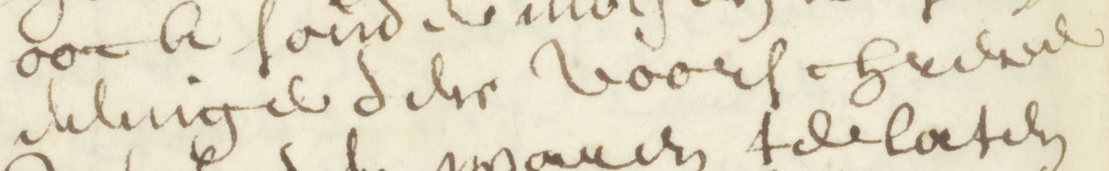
eenige der voorschreve
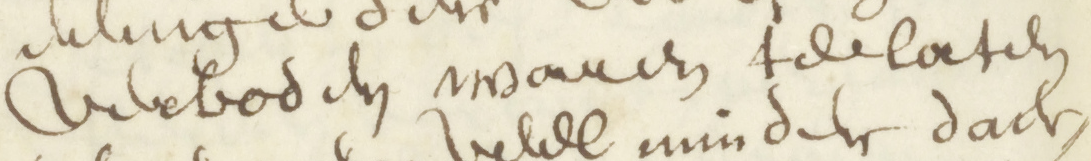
verboden waren te laten
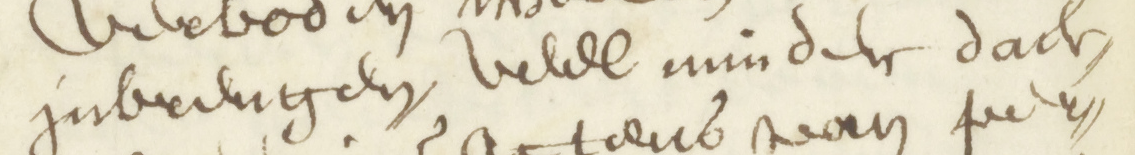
inbrengen, veel minder daer„
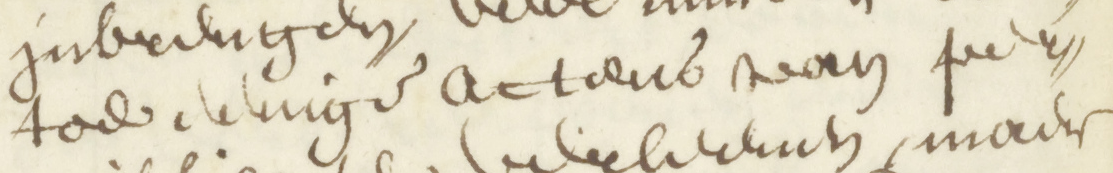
toe eenige actens van per„
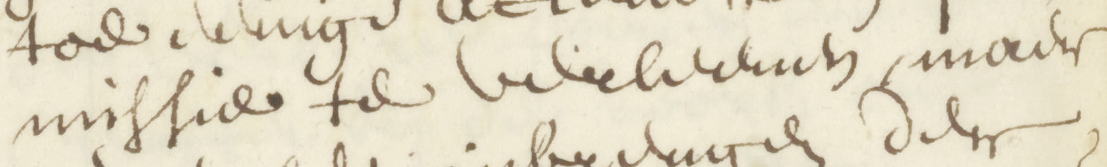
missie te verleenen, maer
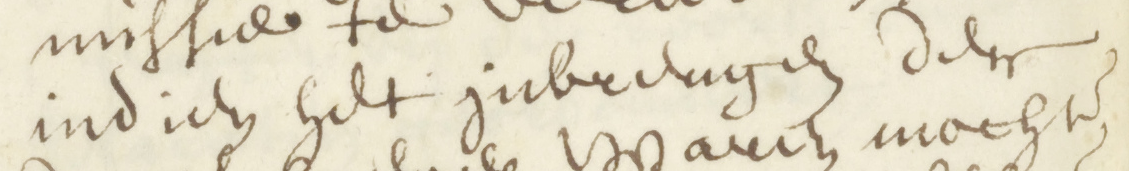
indien het inbrengen der
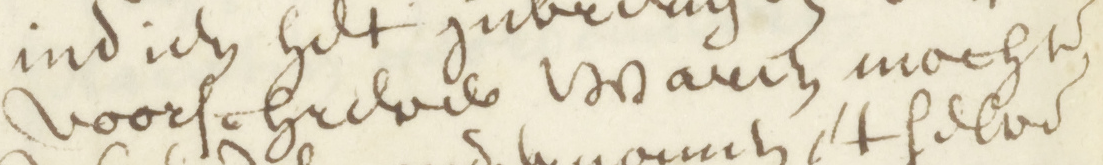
voorschreve Waren mochte
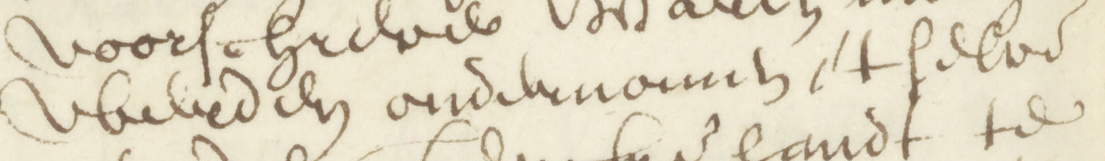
werden ondernomen, 't selve
